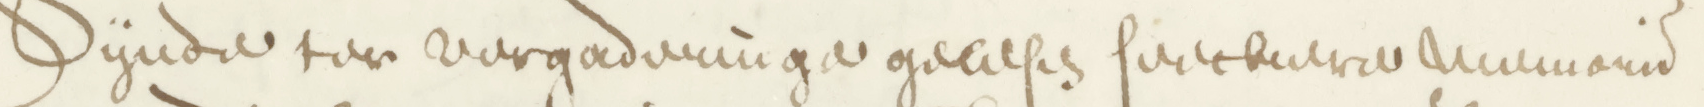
Sijnde ter vergaderinge gelesen seeckere memorie
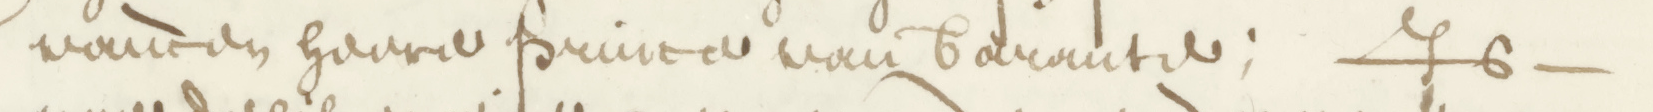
vanden heere prince van Tarante; Is —
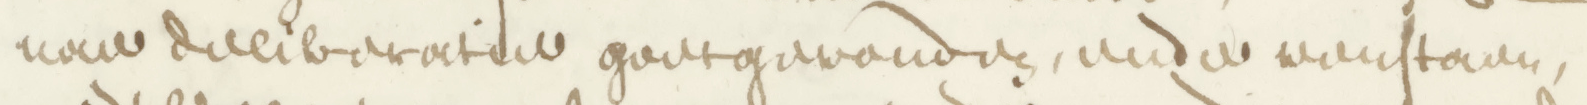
nae deliberatie goetgevonden, ende verstaen,
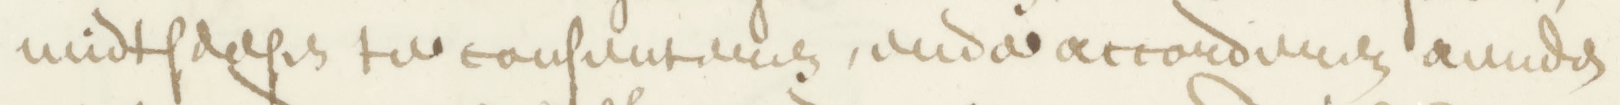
midtsdesen te consenteren, ende accorderen aenden
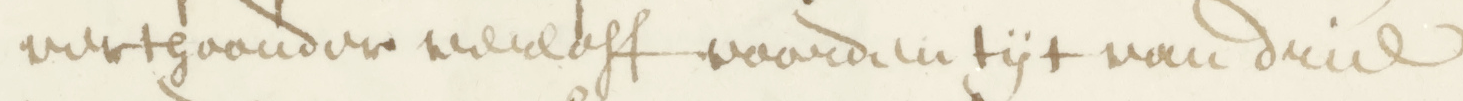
verthoonder verloff voorden tijt van drie
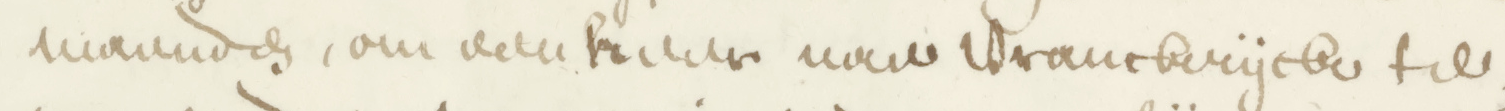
maenden, om een keer nae Vranckrijck te
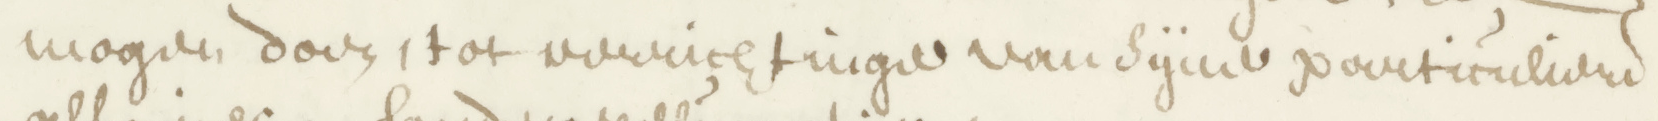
mogen doen, tot verrichtinge van sijne particuliere
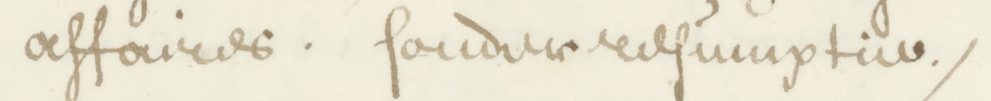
affaires, sonder resumptie.
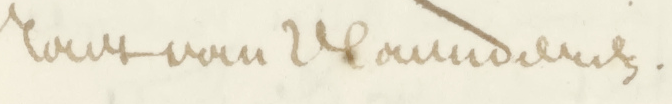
Raet van Vlaenderen.
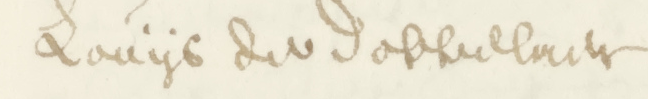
Louijs de Dobbelaer
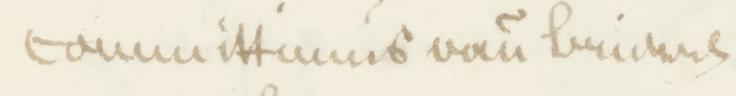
committimus van brieven
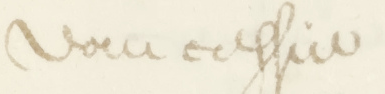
van cessie
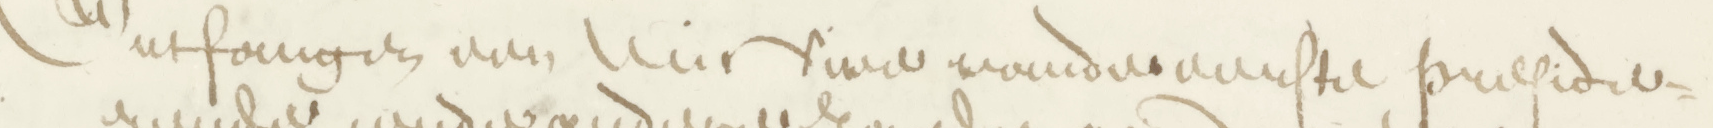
Ontfangen een Missive vande eerste preside=
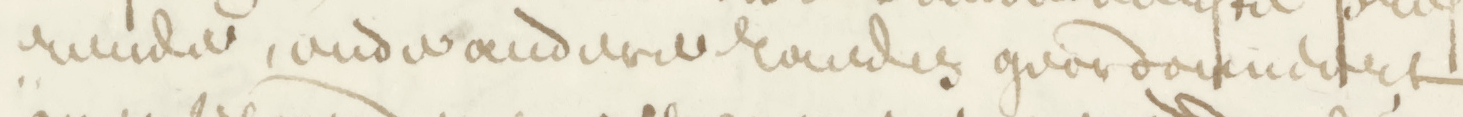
„rende, ende andere Raeden geordonneert
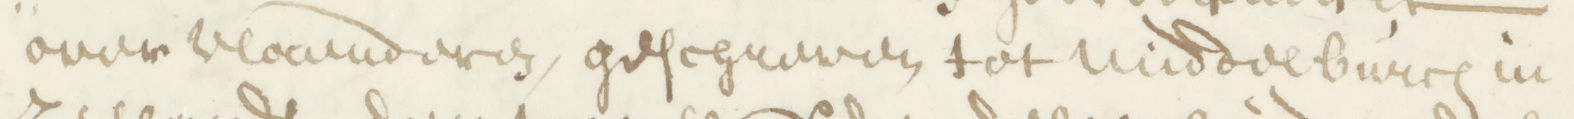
over Vlaenderen, geschreven tot middelburch in
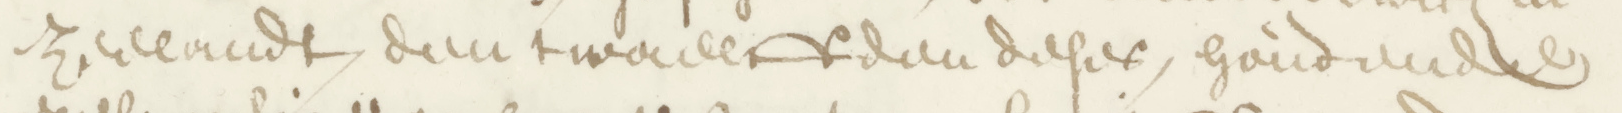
Zeelandt, den twaelffden deses, houdende
